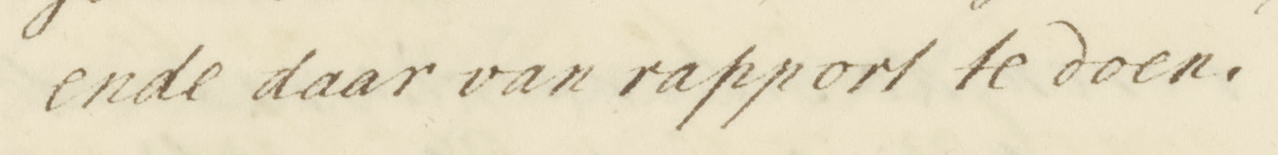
ende daar van rapport te doen.
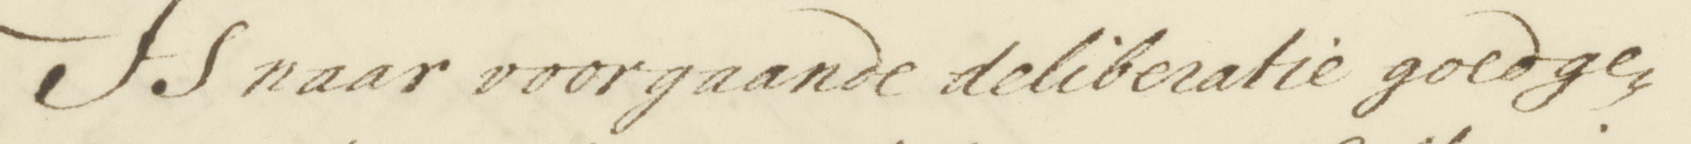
Is naar voorgaande deliberatie goedge,,
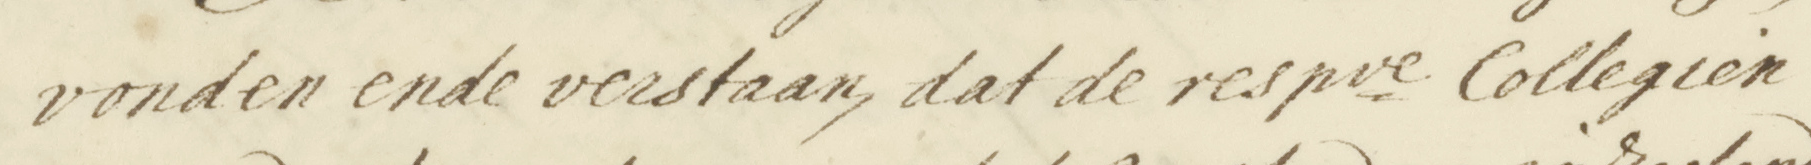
vonden ende verstaan, dat de respve Collegien
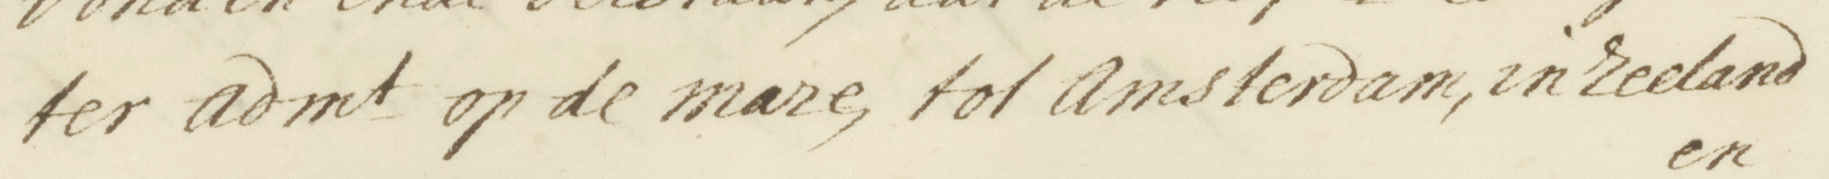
ter Admt op de Maze, tot Amsterdam, in Zeeland
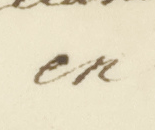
en
